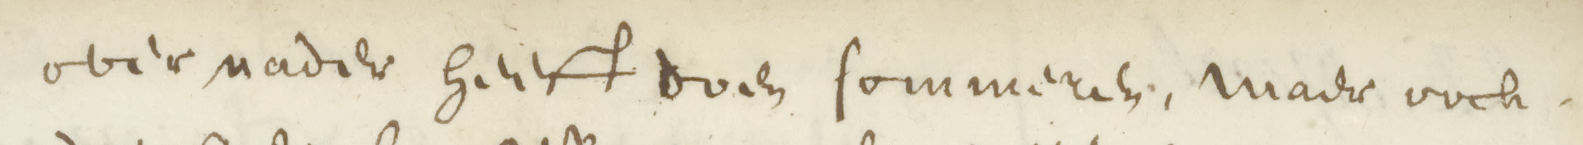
over nader heeft doen sommeren, maer oock
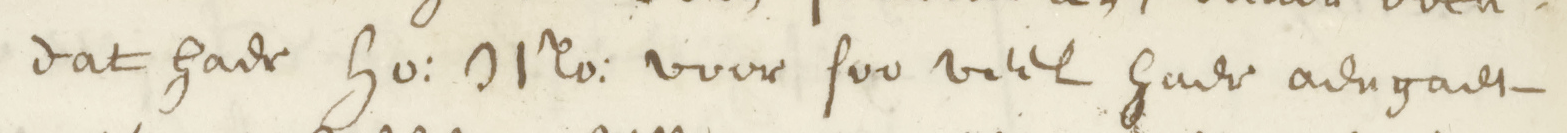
dat haer ho:Mo: voor soo veel haer aengaet
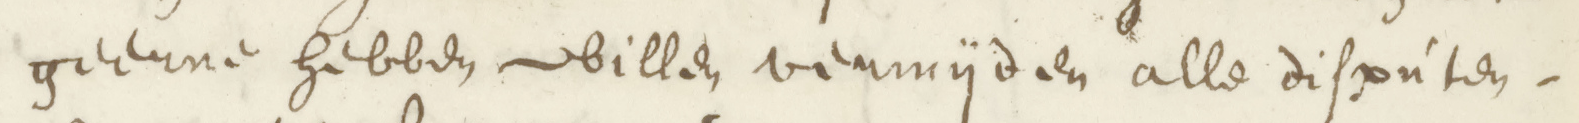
geerne hebben willen vermijden alle disputen
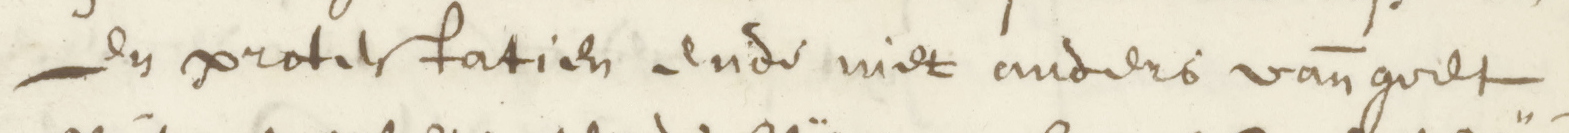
en protestatien ende niet anders van goet„
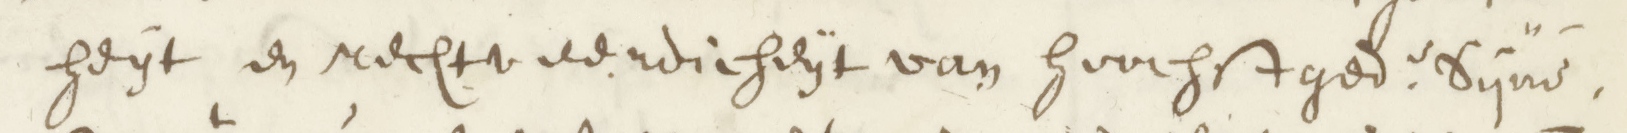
heijt en rechtveerdicheijt van hoochstgede. Sijne
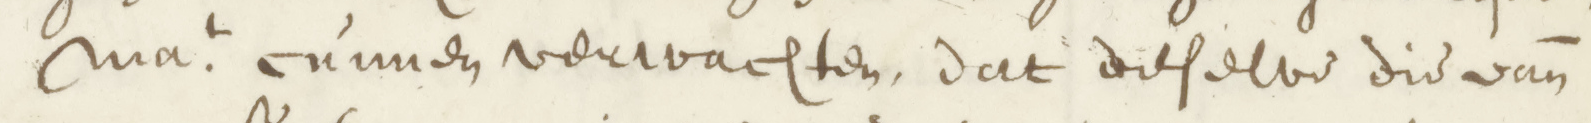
mat. cunnen verwachten, dat deselve die van
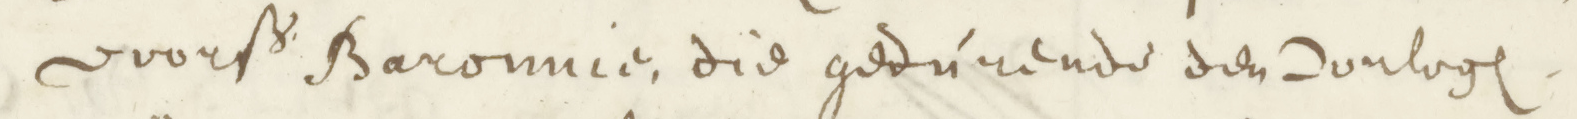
voors. Baronnie, die gedurende den Oorlogh
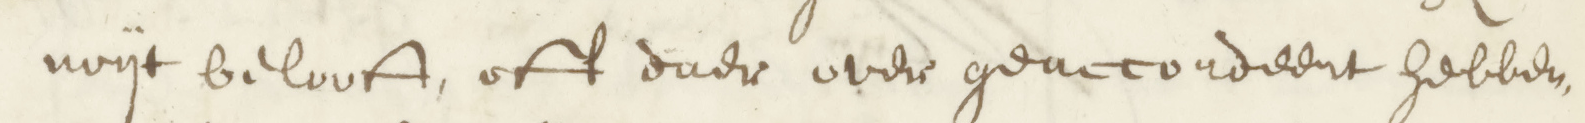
noijt belooft, off daer over geaccordeert hebben,
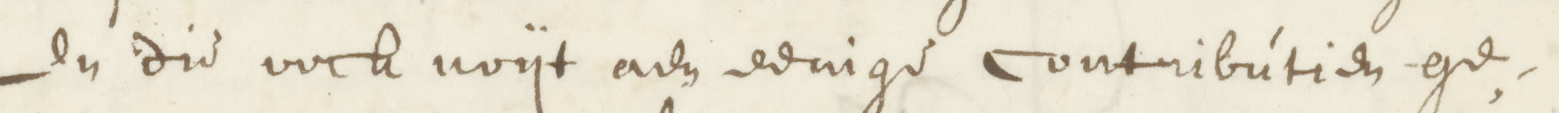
en die oock noijt aen eenige contributien ge„
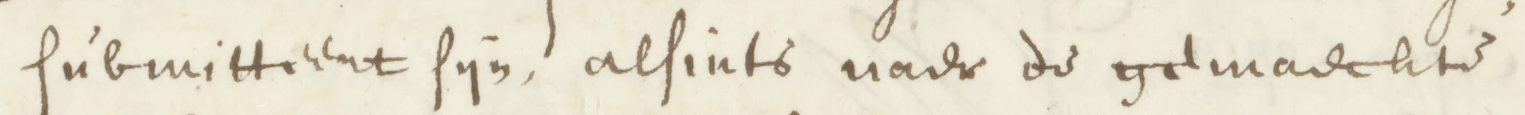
submitteert sijn, alsints naer de gemaeckte
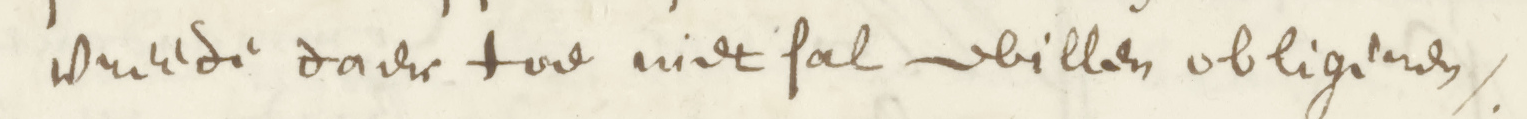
Vreede daer toe niet sal willen obligeren.
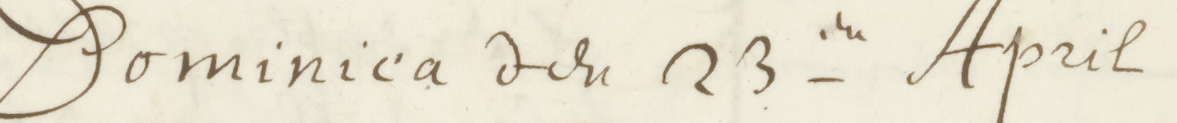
Dominica den 23en. April
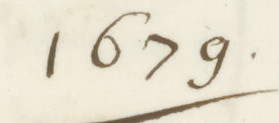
1679.
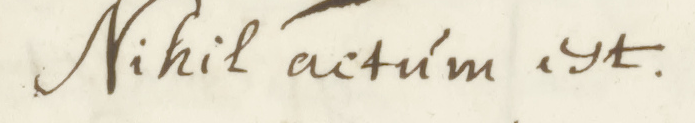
Nihil actum est.
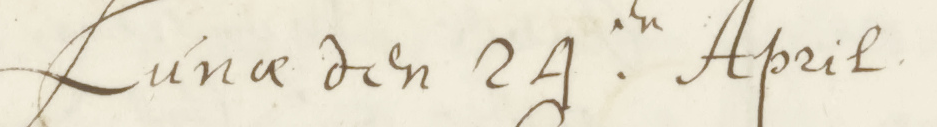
Lunæ den 24en. April.
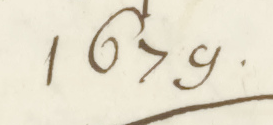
1679.
